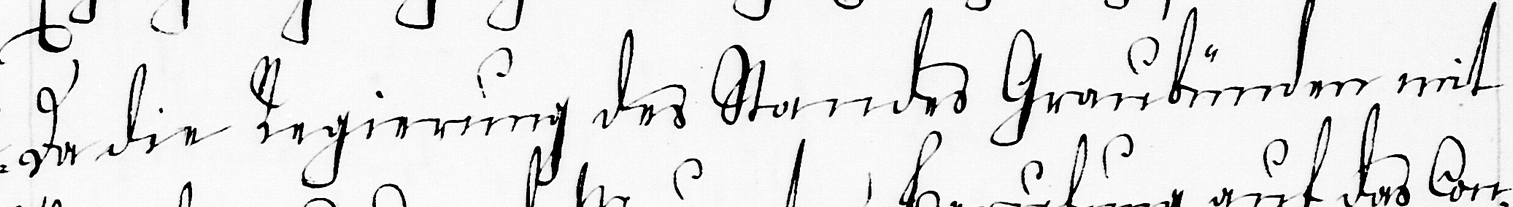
Da die Regierung des Standes Graubünden mit
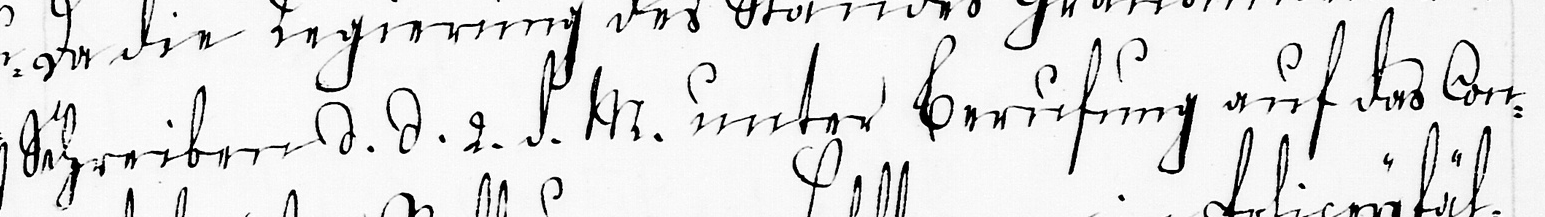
Schreiben d. d. 2. d. M. unter Berufung auf das Con¬
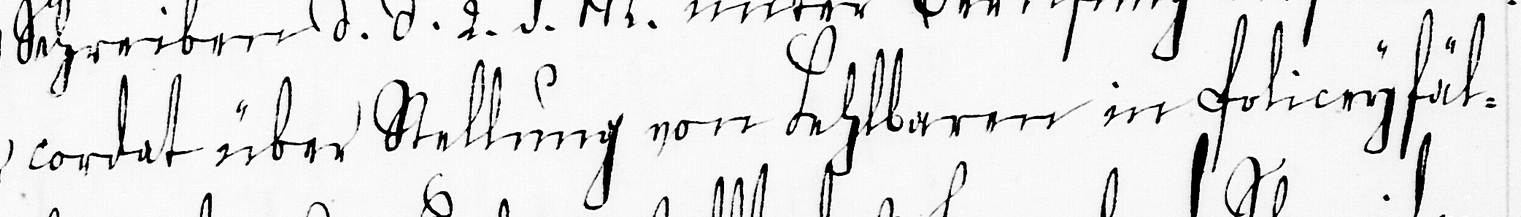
cordat über Stellung von Fehlbaren in Policeyfäl¬
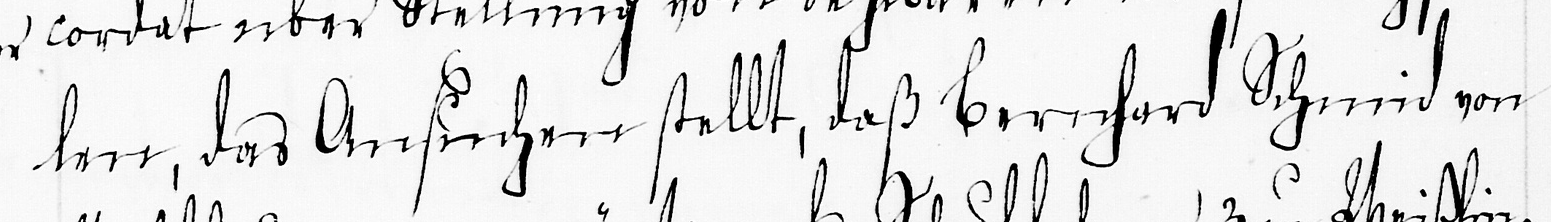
len, das Ansuchen stellt, daß Bernhard Schmid von
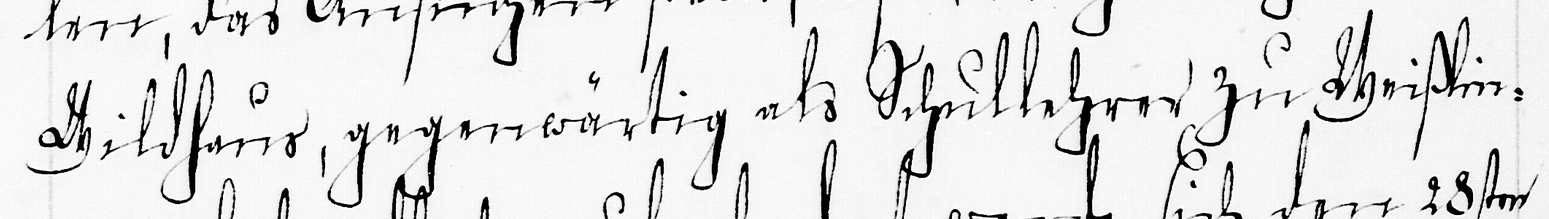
Wildhaus, gegenwärtig als Schullehrer zu Weißlin¬
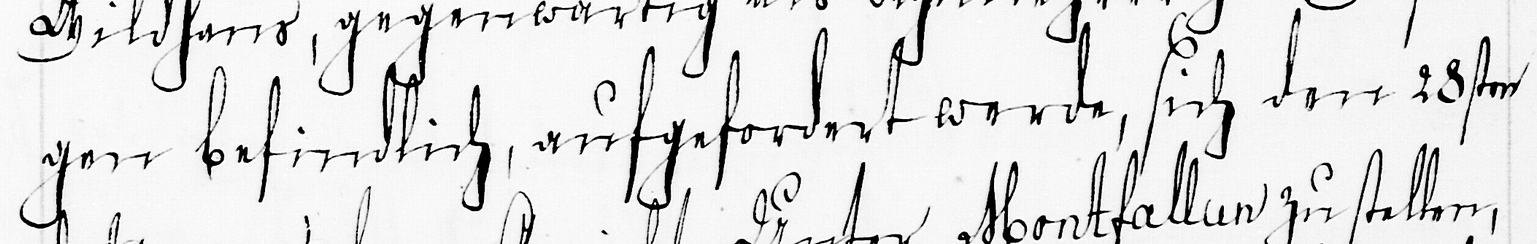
gen befindlich, aufgefordert werde, sich den 28sten
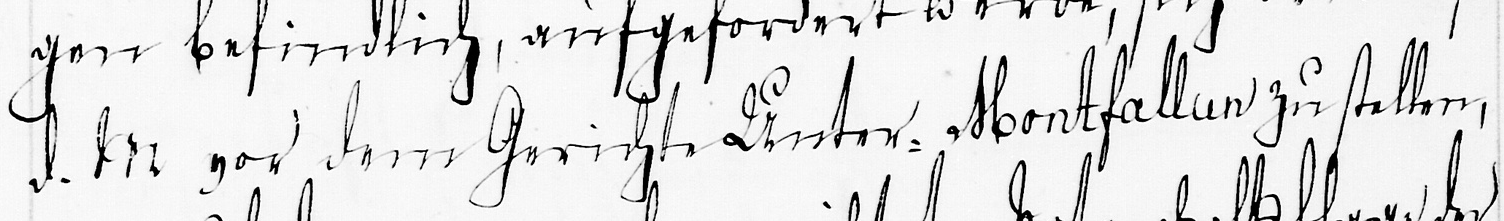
d. M. vor dem Gerichte Unter-Montfallun zu stellen,
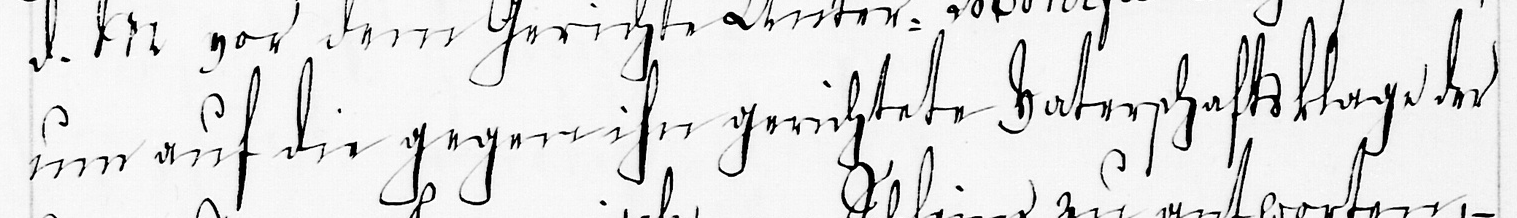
um auf die gegen ihn gerichtete Vaterschaftsklage der
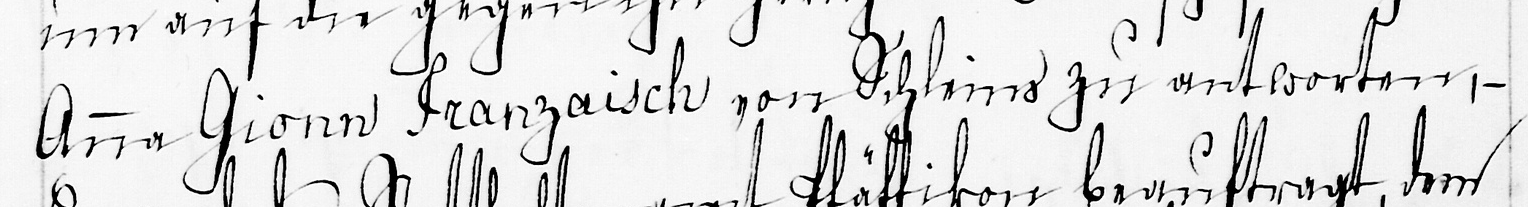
Anna Gionn Franzaisch von Schleins zu antworten, –
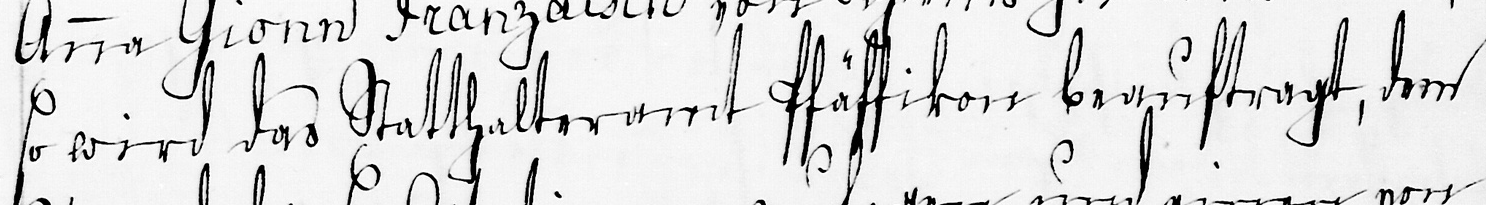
so wird das Statthalteramt Pfäffikon beauftragt, dem
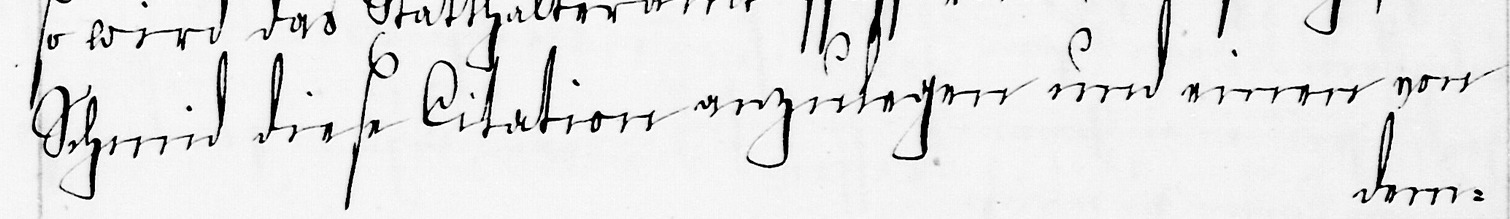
Schmid diese Citation anzulegen und einen von
